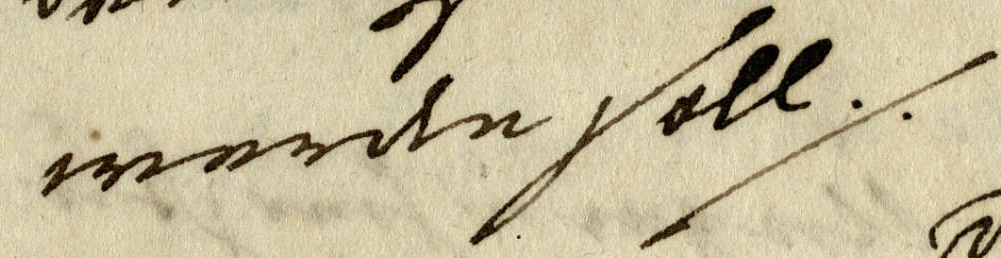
werden soll.
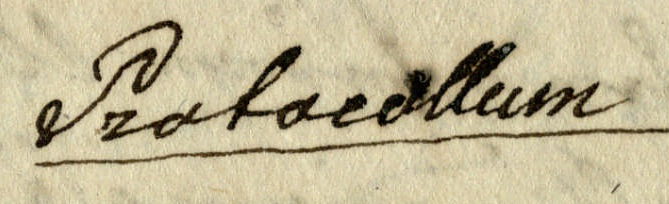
Protocollum
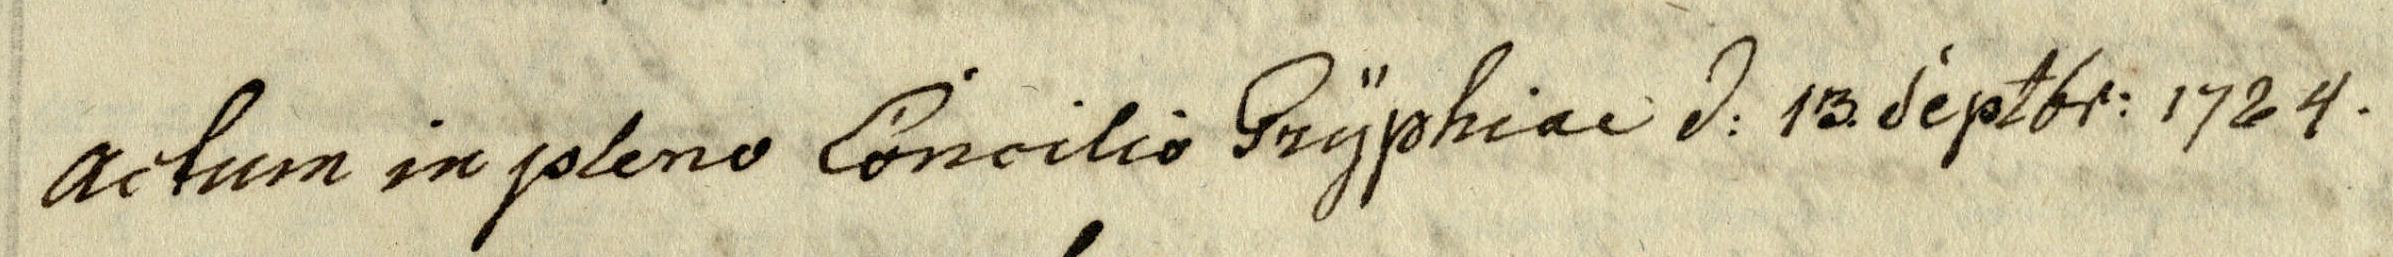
Actum in pleno Concilio Grÿphiae d. 13. Septbr. 1784.
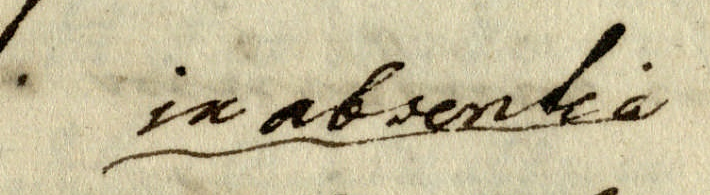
in absentia
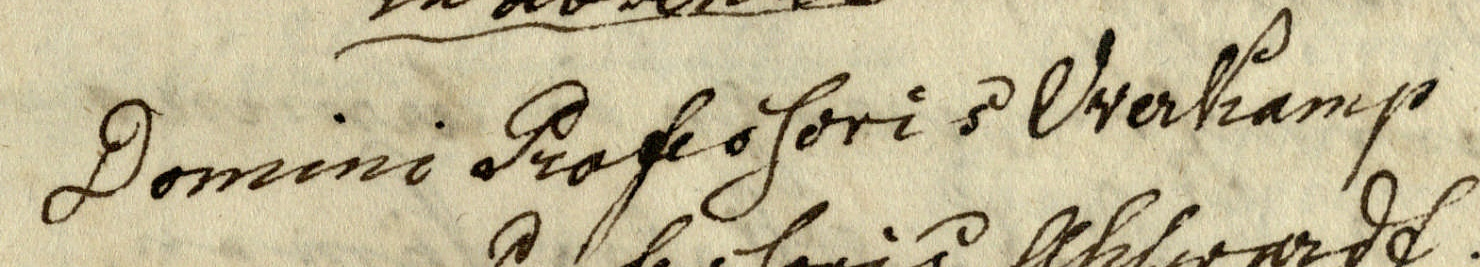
Domini Professoris Overkamp
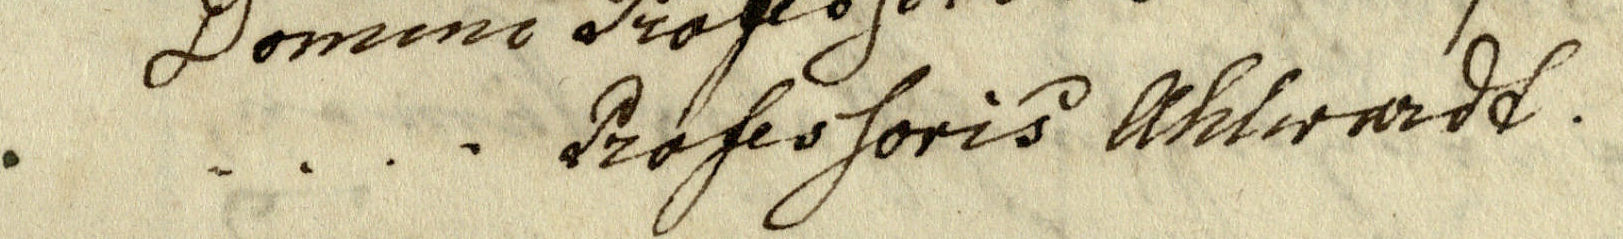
Professoris Ahlwardt.
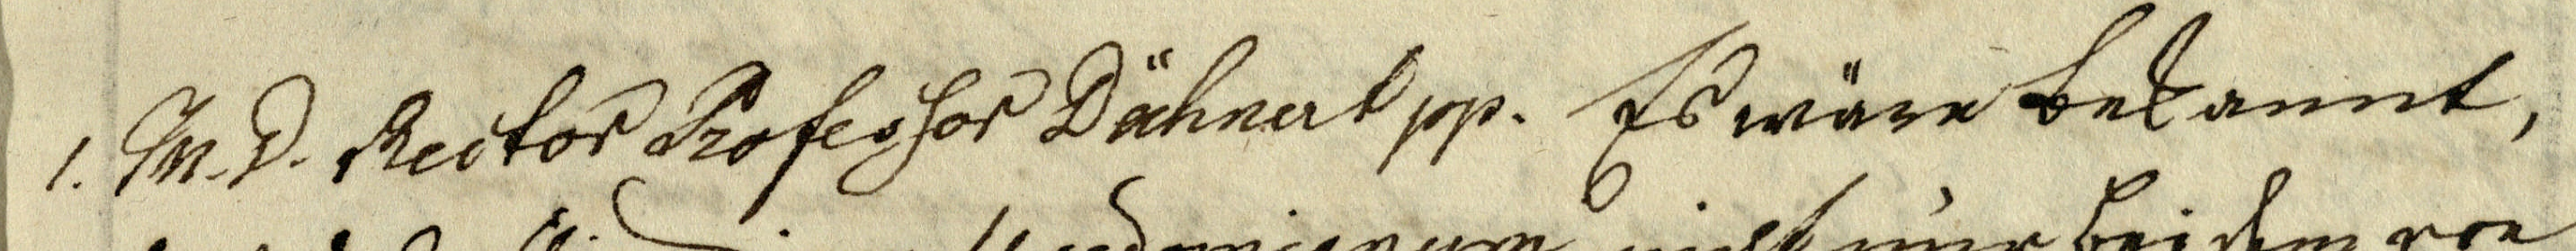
1. M. D. Rector Professor Dähnert pp. Es wäre bekannt,
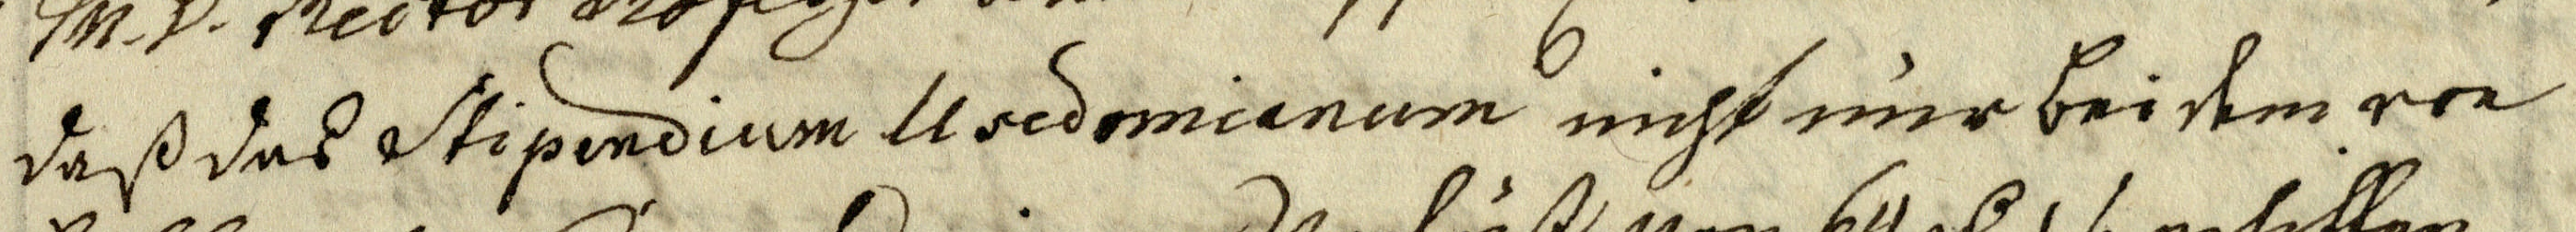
daß das Stipendium Usedomianum nicht nur bei dem von
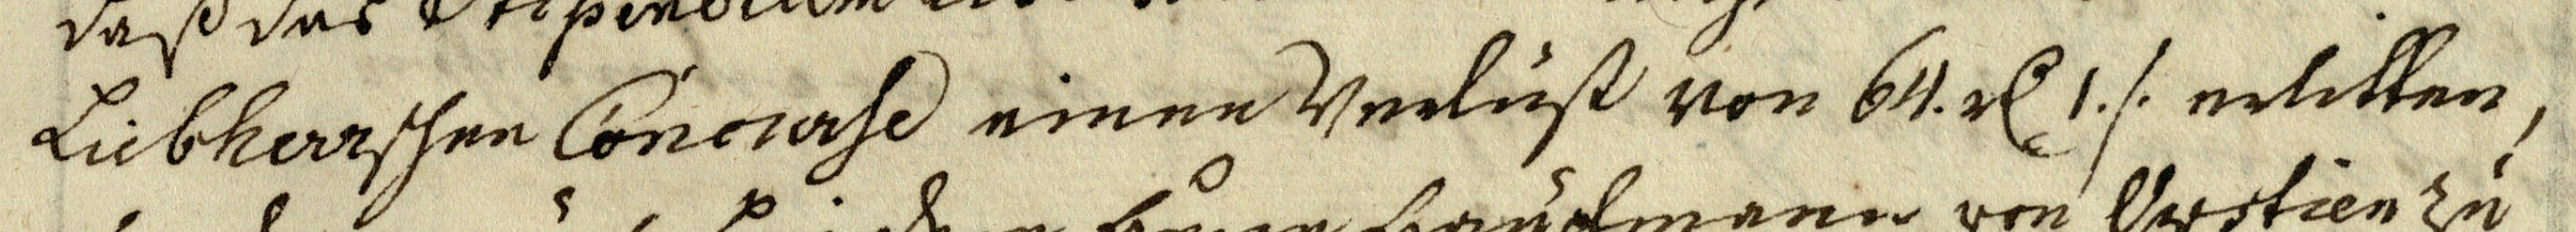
Liebherrschen Concurse einen Verlust von 64. r. 1.s. erlitten,
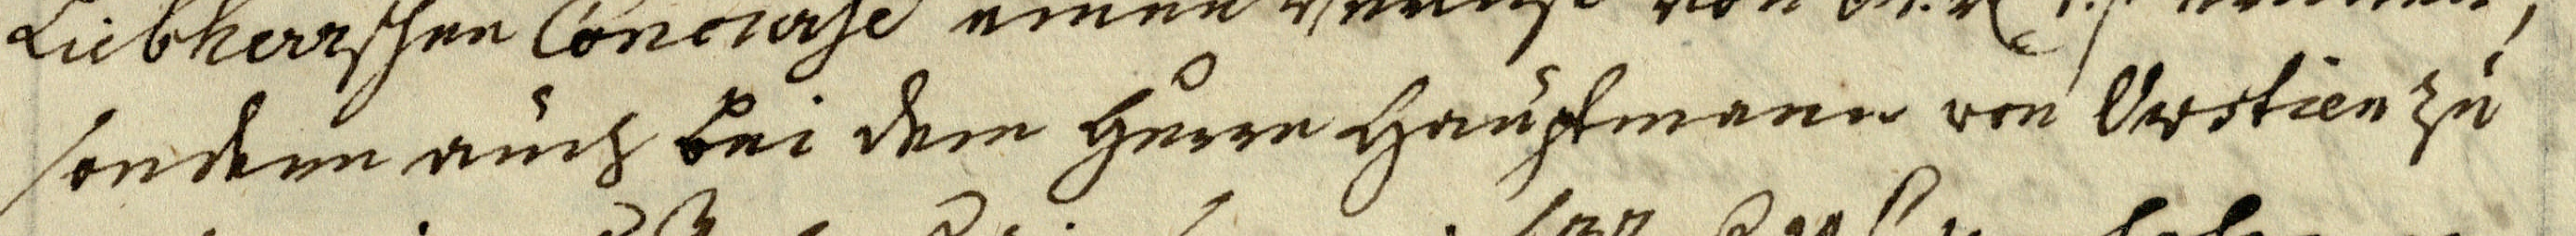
sondern auch bei dem Herrn Hauptmann von Owstien zu
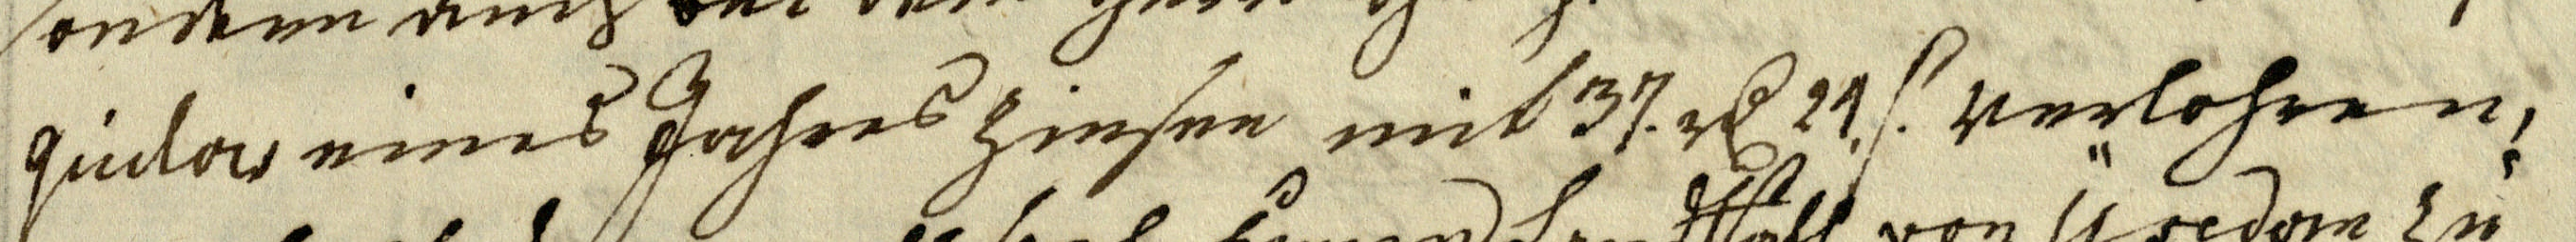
Quilow eines Jahres Zinsen mit 37. r. 21. s. verlohren,
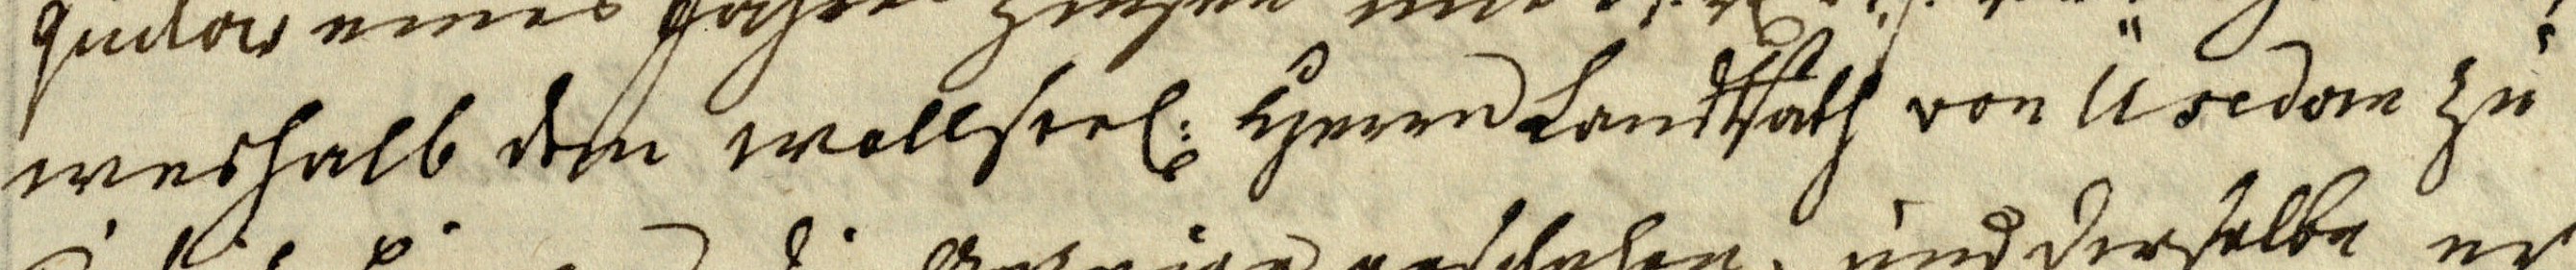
weshalb dem wollseel. Herrn Land Rath von Usedom zu
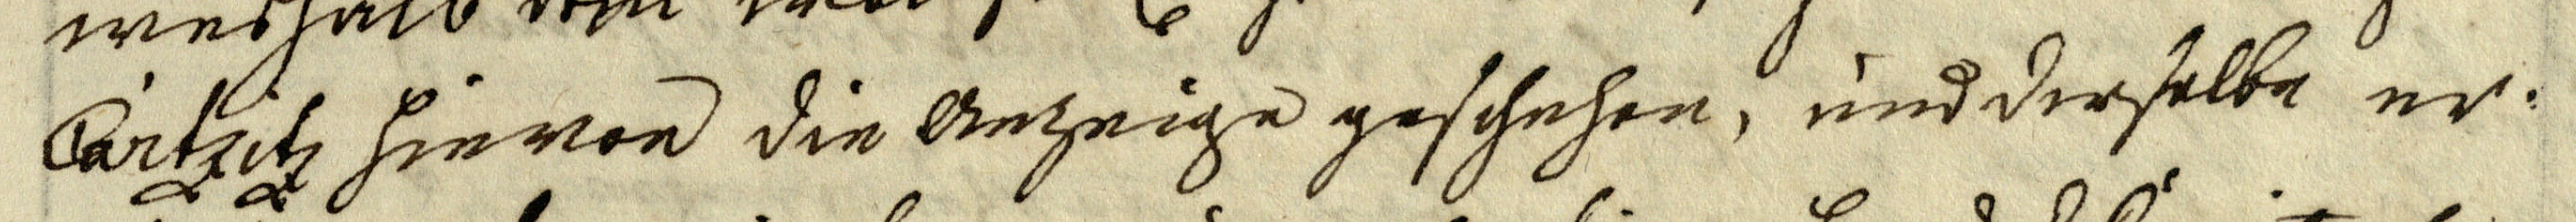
Cartzitz hievon die Anzeige geschehen, und derselbe er¬
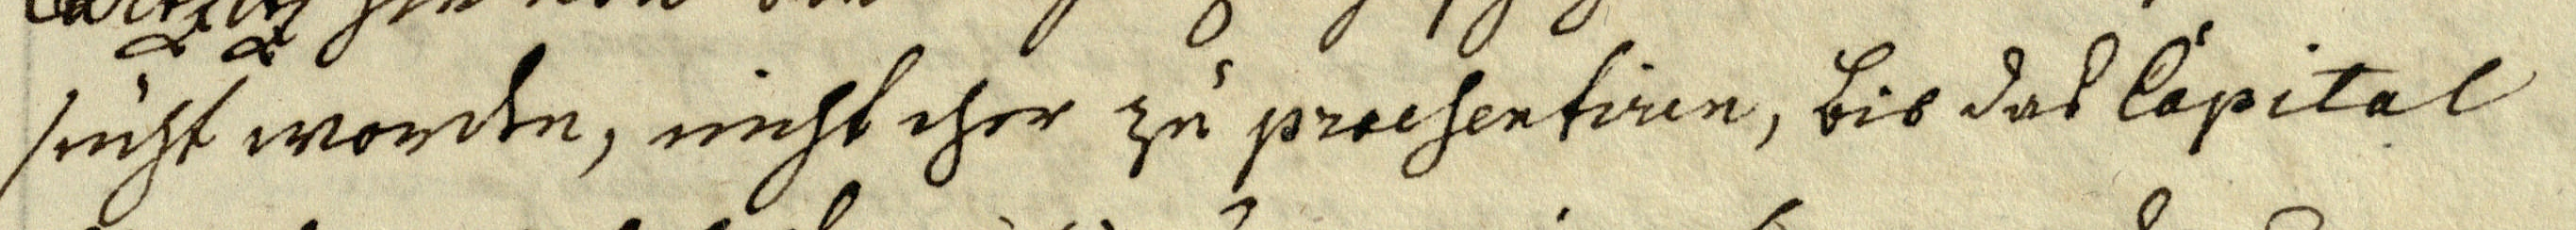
sucht worden, nicht eher zu praesentiren, bis das Capital
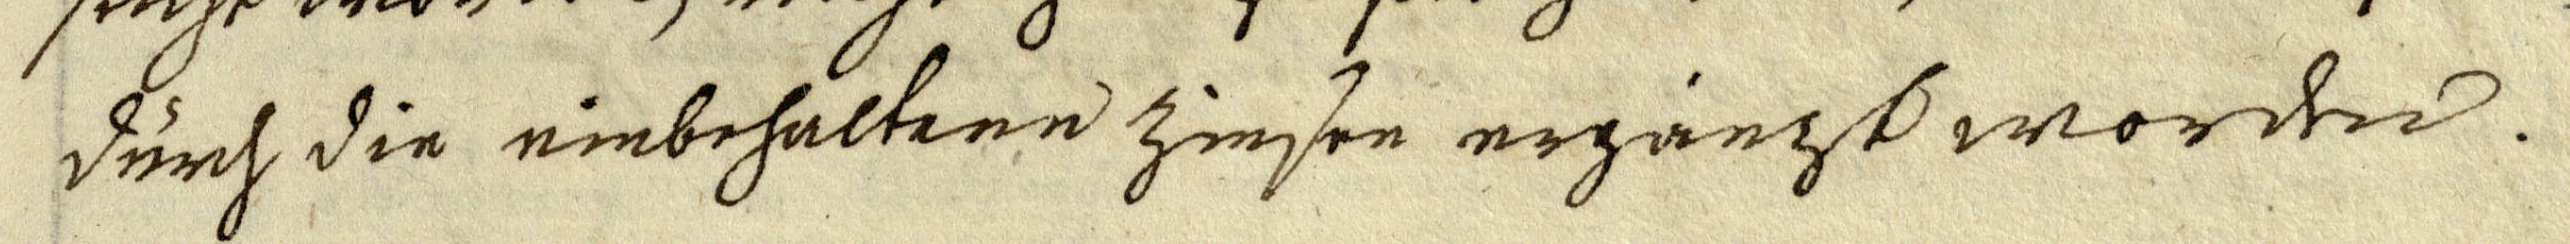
durch die einbehaltene Zinsen ergänzt worden.
